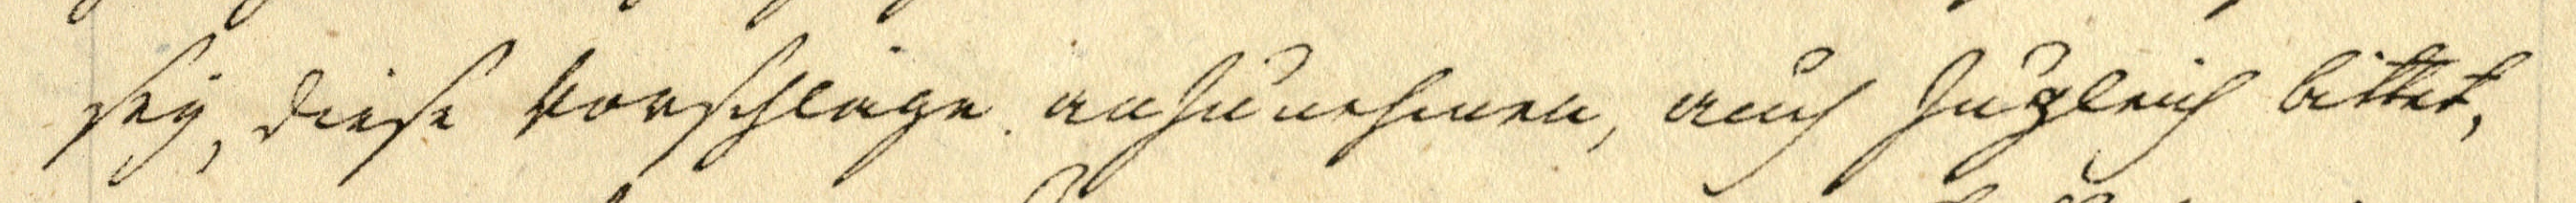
seÿ, diese Vorschläge anzunehmen, auch zugleich bittet,
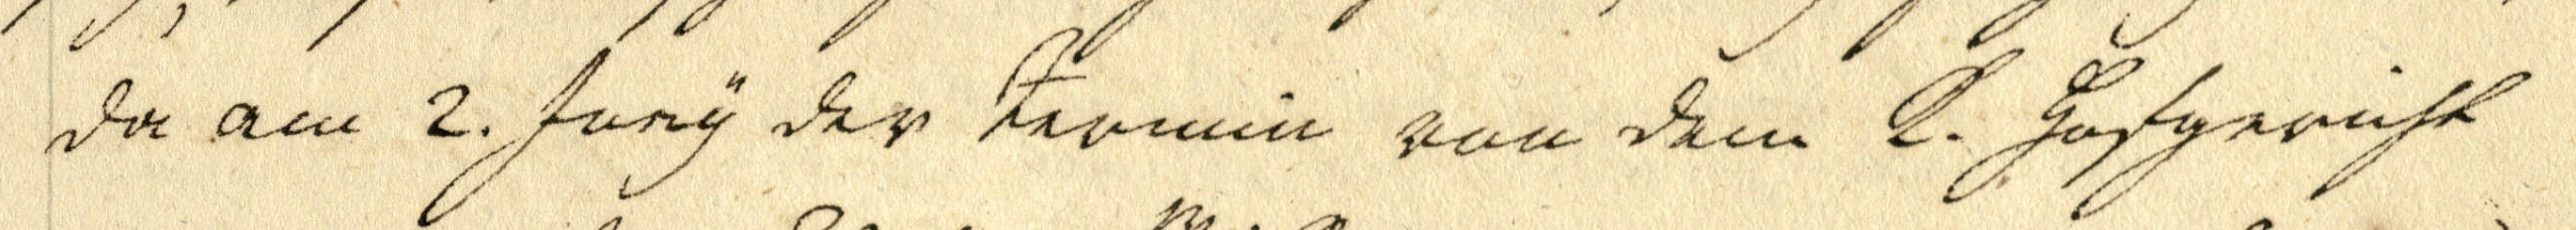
da am 2. Junÿ der Termin von dem K. Hofgericht
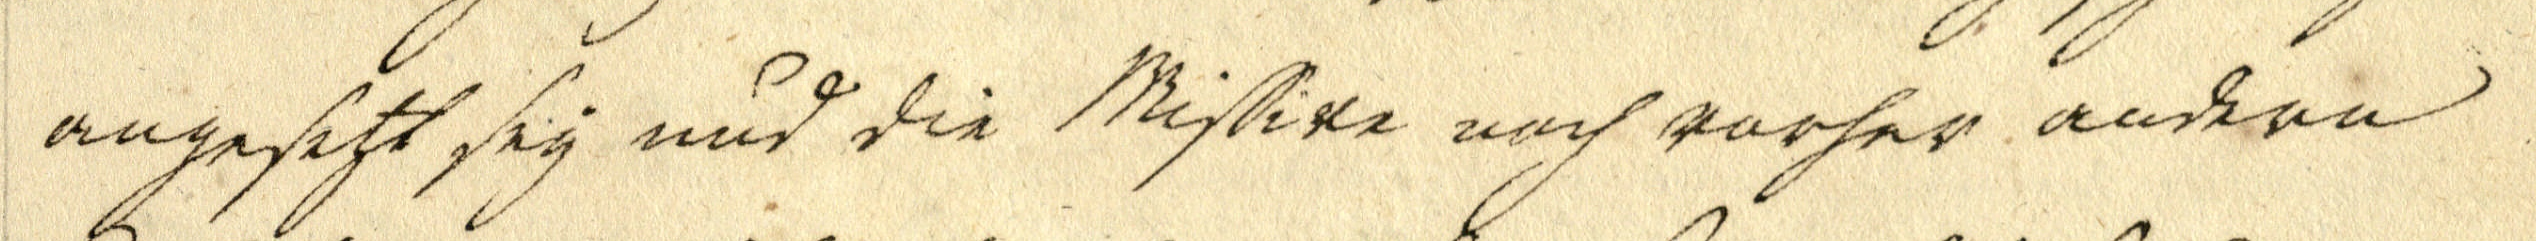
angesetzt seÿ und die Missive noch vorher andern
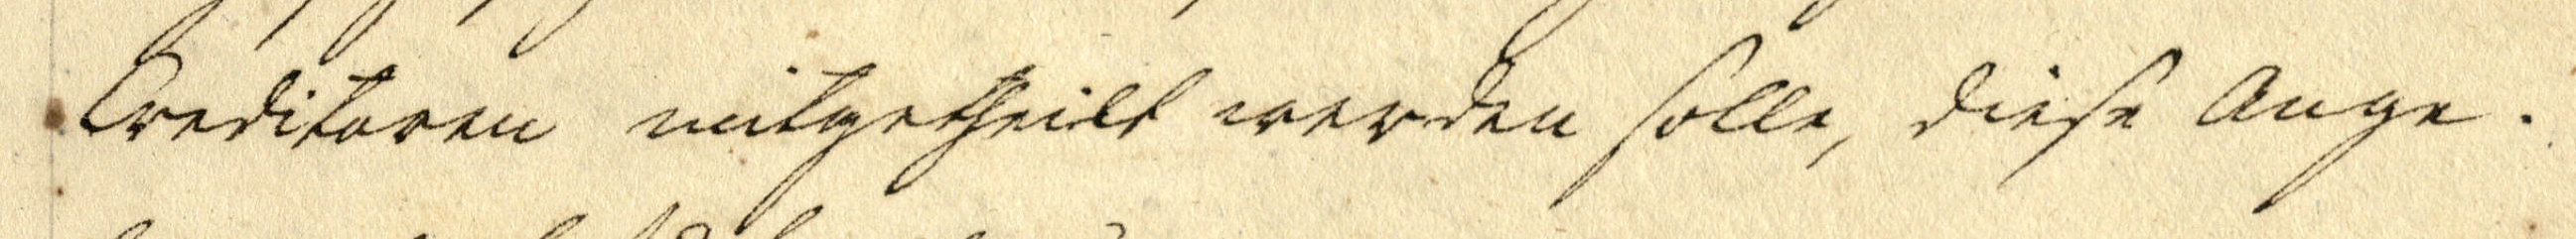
Creditoren mitgetheilt werden solle, diese Ange¬
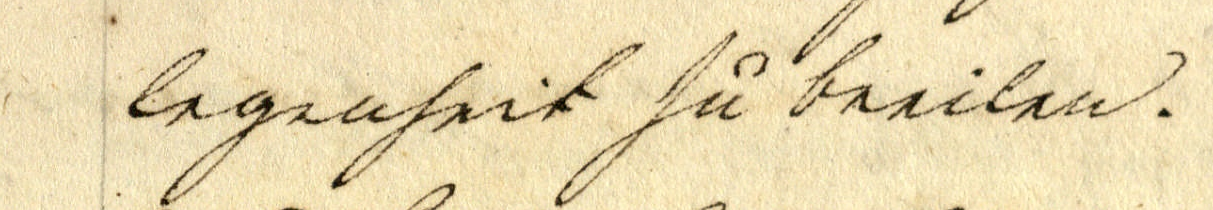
legenheit zu beeilen.
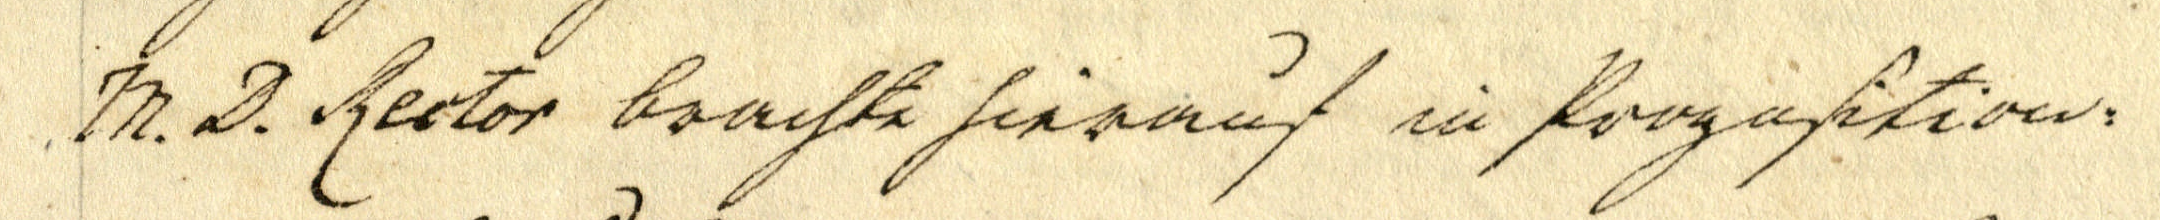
M. D. Rector brachte hierauf in Proposition:
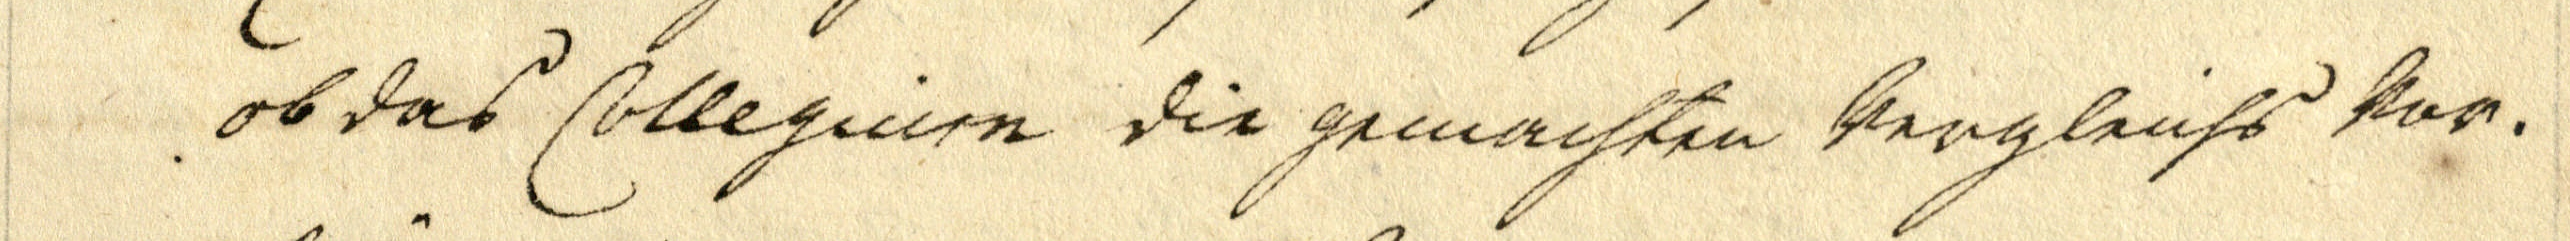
ob das Collegium die gemachten Vergleichs Vor¬
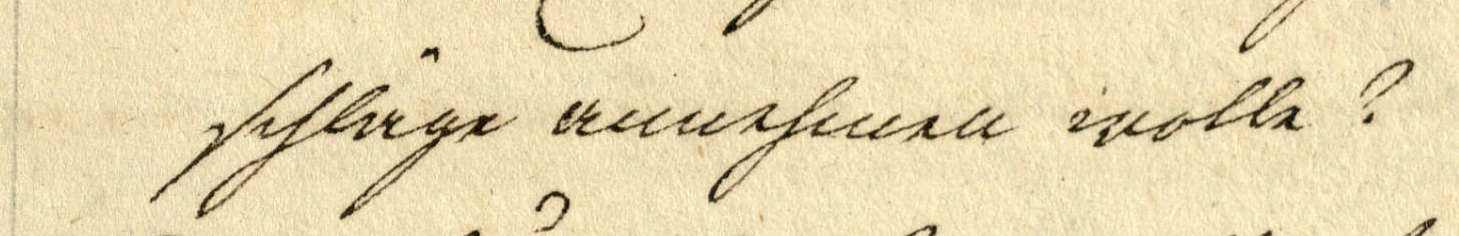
schläge annehmen wolle?
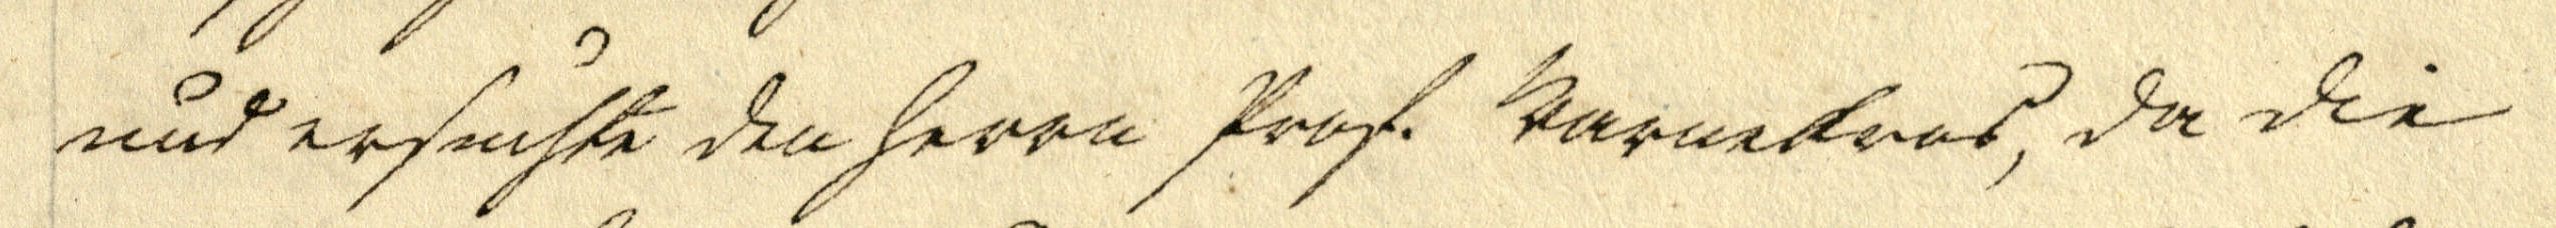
und ersuchte den herrn Prof. Warnekros, da die
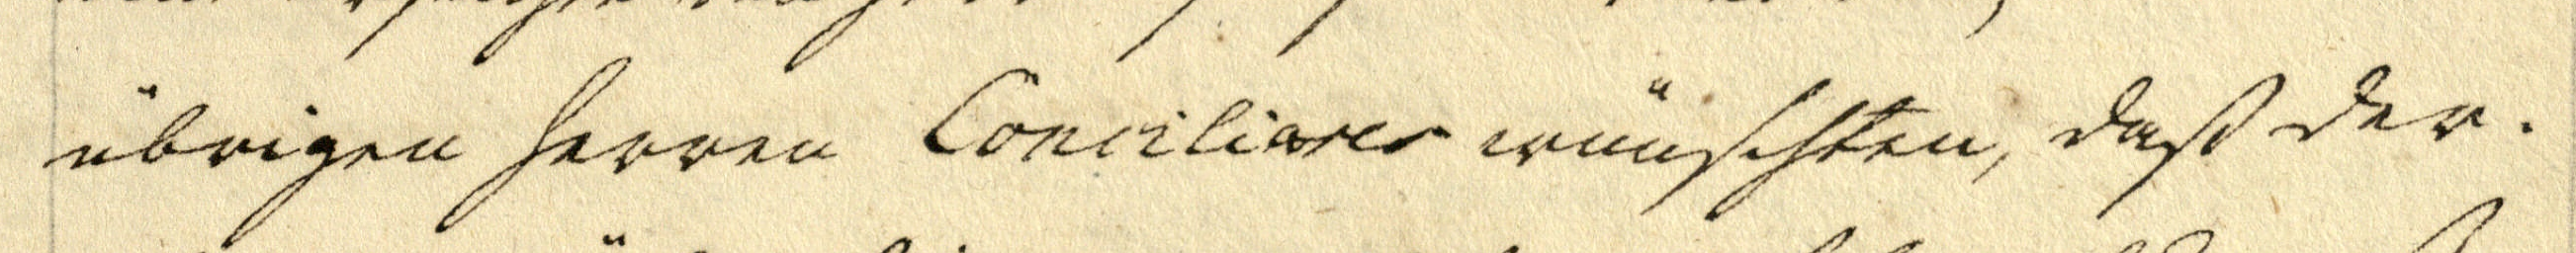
übrigen herren Conciliares wünschten, daß der¬
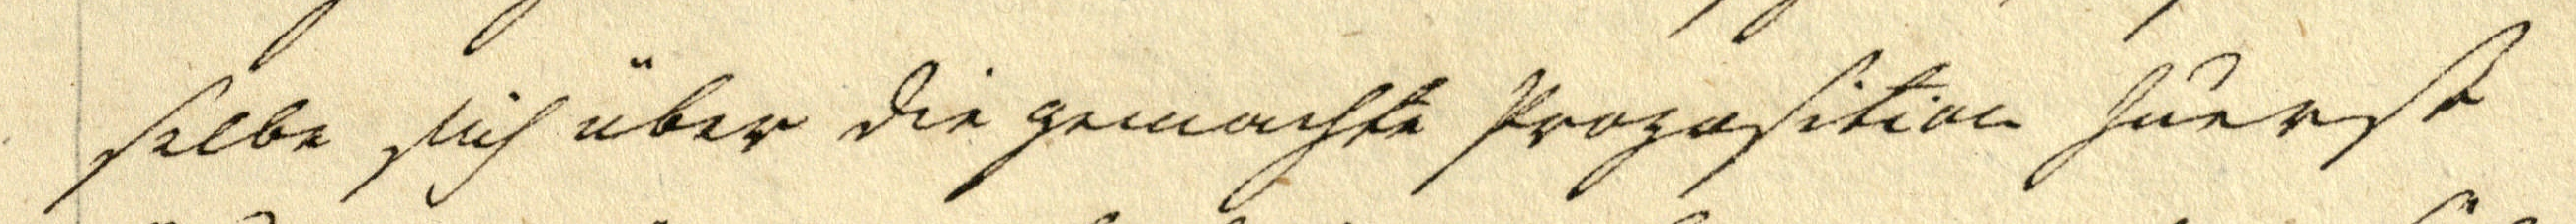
selbe sich über die gemachte Proposition zuerst
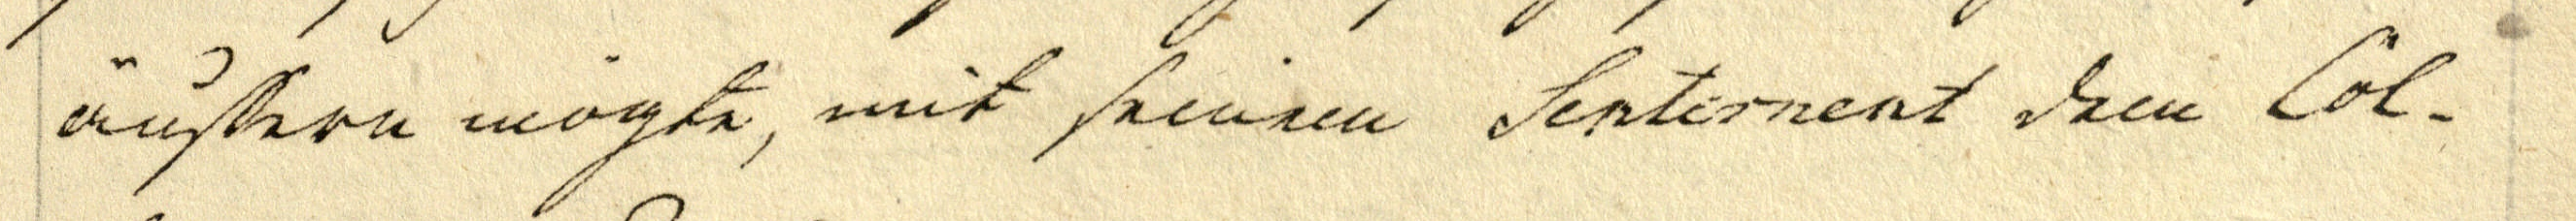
äussern mögte, mit seinem Septirnent dem Col¬
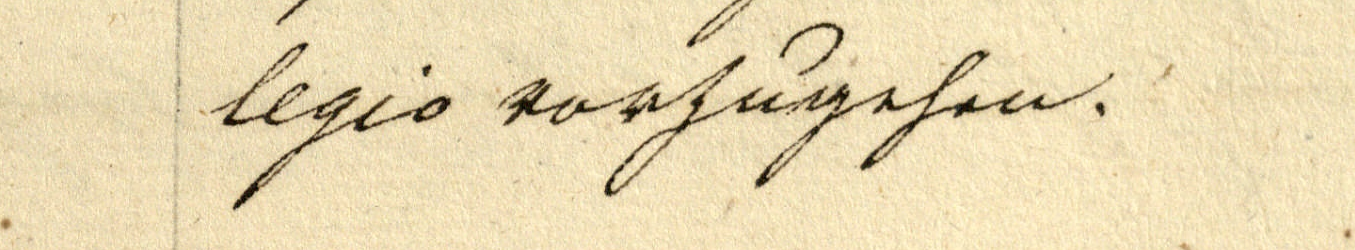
legio vorzugehen.
